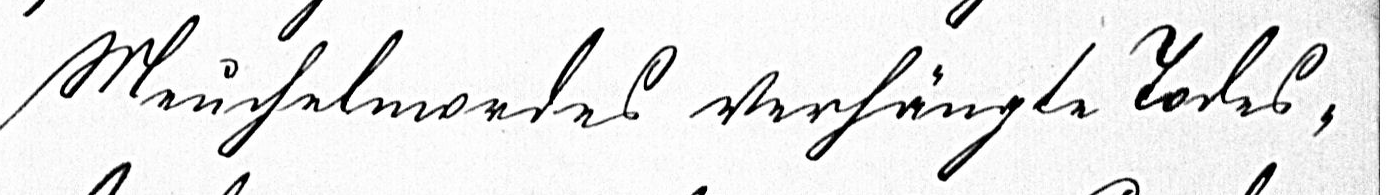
Meuchelmordes verhängte Todes¬
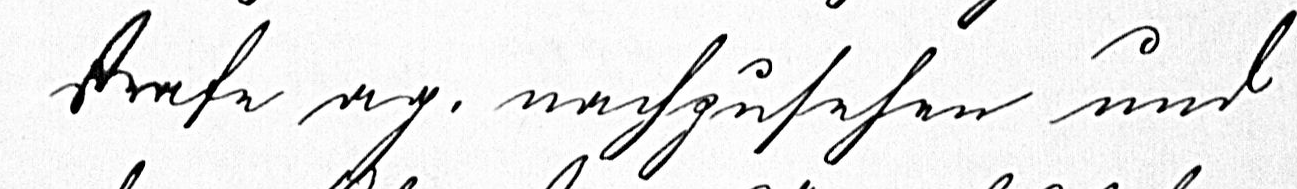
strafe ag. nachzusehen und
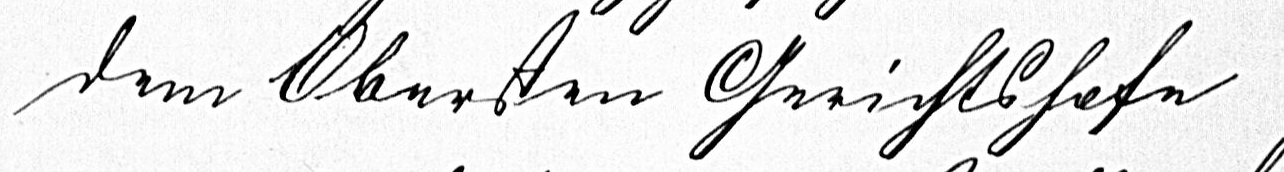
dem Obersten Gerichtshofe
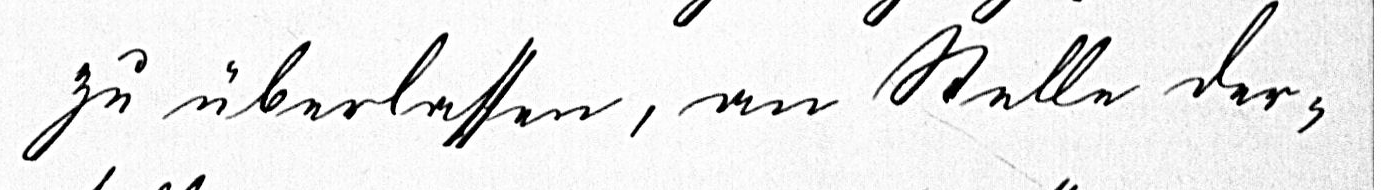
zu überlassen, an Stelle der¬
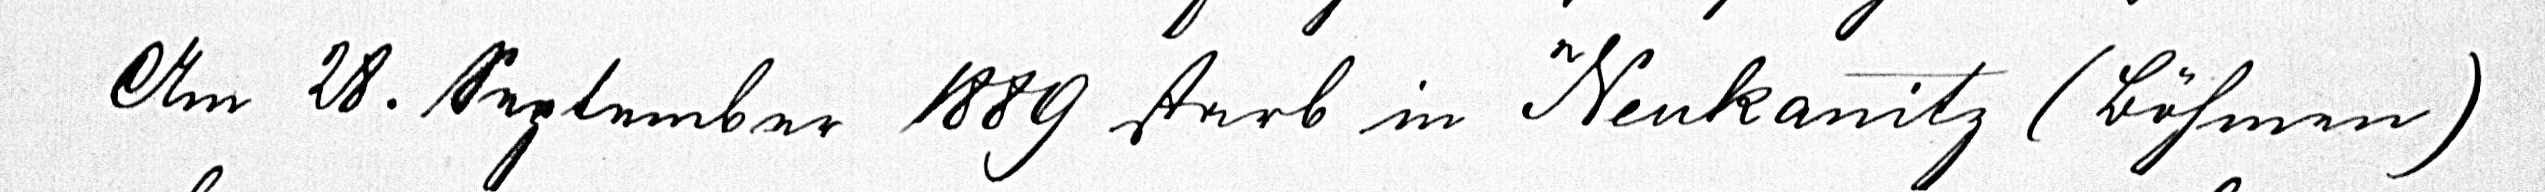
Am 28. September 1889 starb in Neukanitz (Böhmen)
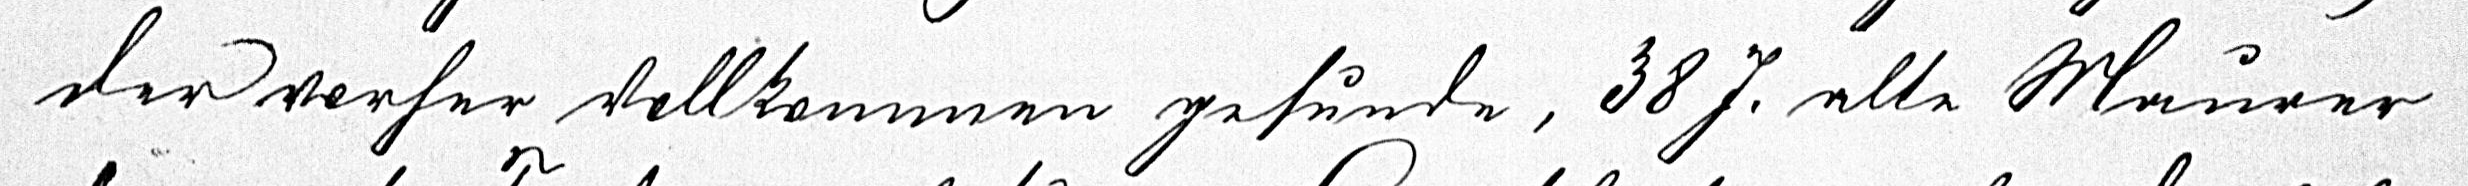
der vorher vollkommen gesunde, 38 J. alle Maurer
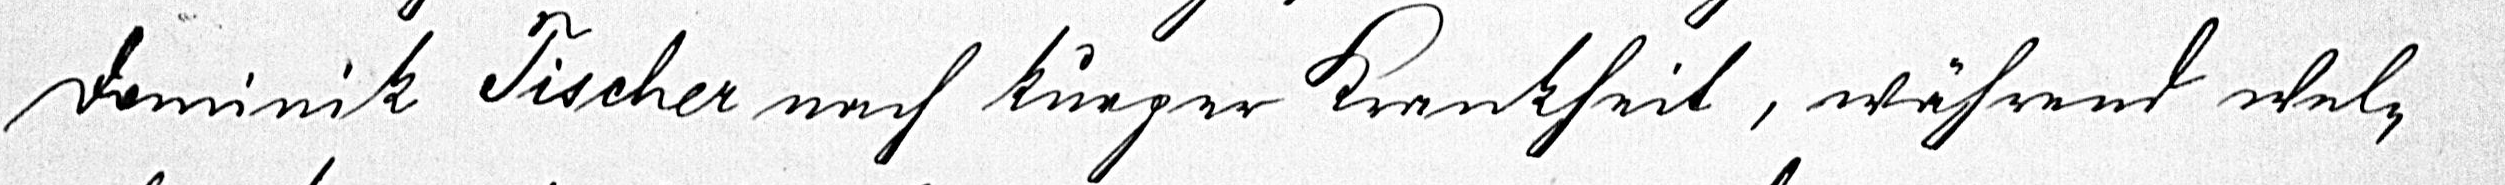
Dominik Tischer nach kurzer Krankheit, während wel¬
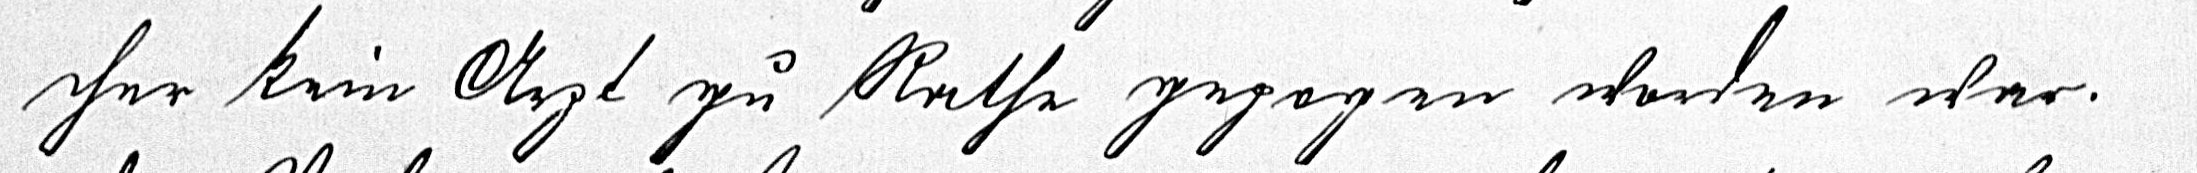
cher kein Arzt zu Rathe gezogen worden war.
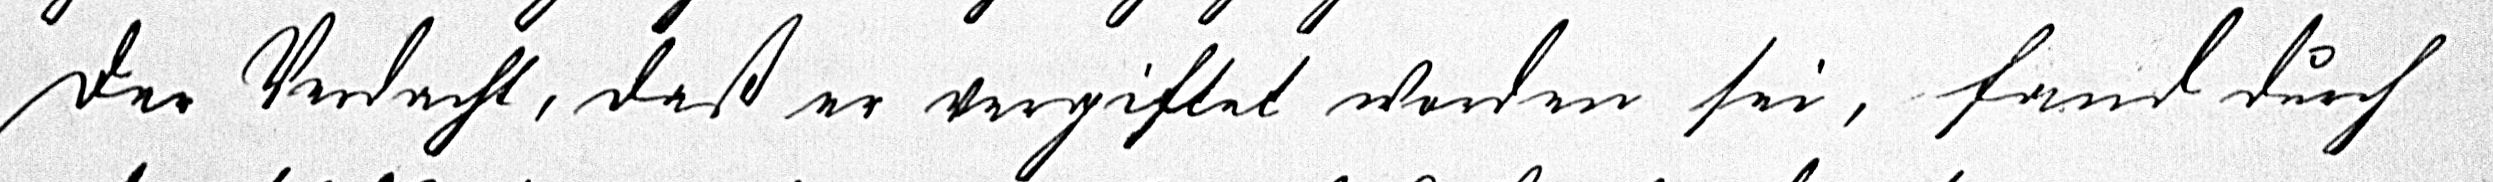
Der Verdacht, daß er vergiftet worden sei, fand durch
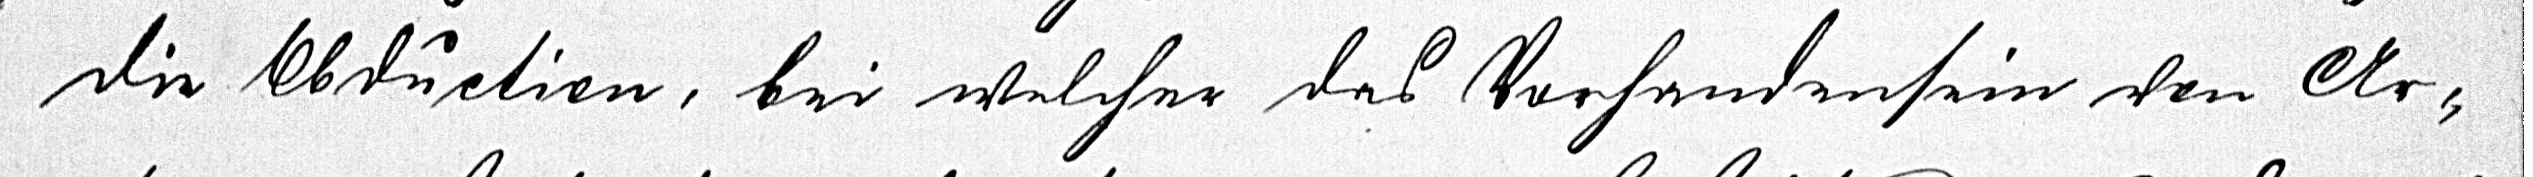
die Obduction, bei welcher das Vorhandensein von Ar¬
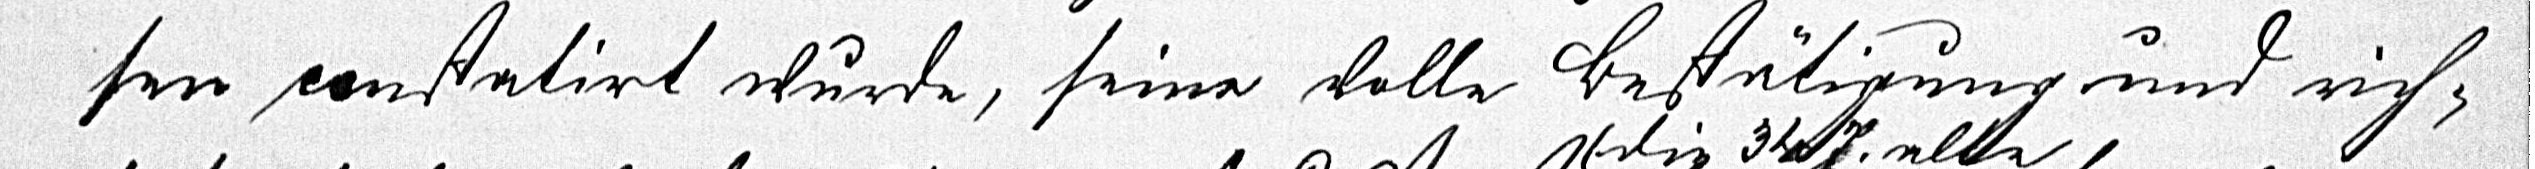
sen constatirt wurde, seine volle Bestätigung und rich¬
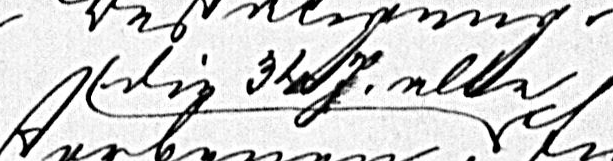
die 34 J. alte
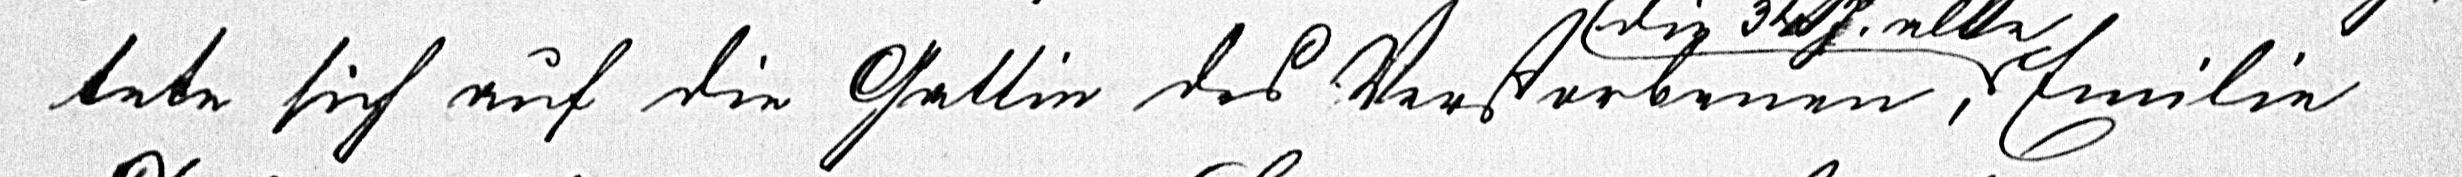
tete sich auf die Gattin des Verstorbenen, Emilie
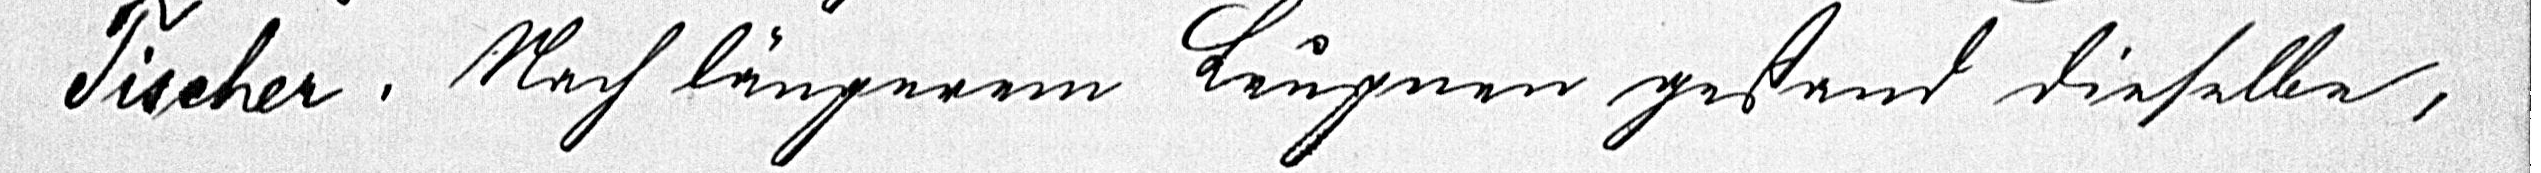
Tischer. Nach längerem Leugnen gestand dieselbe,
